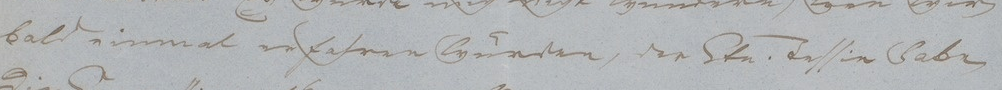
bald einmal erfahren würden, der Ctn. Tessin habe
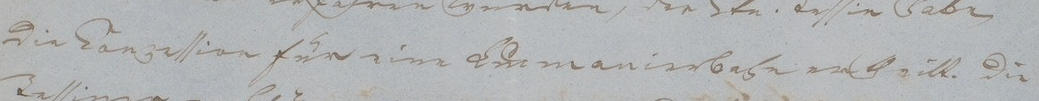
die Conzession für eine Lucmanierbahn ertheilt. Die
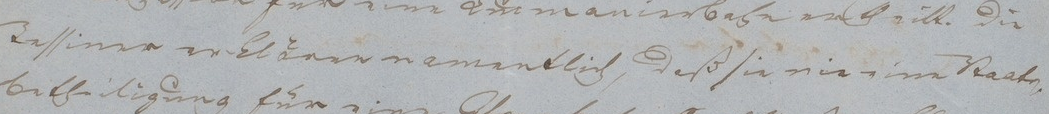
Tessiner erklären namentlich, daß sie nie eine Staats-
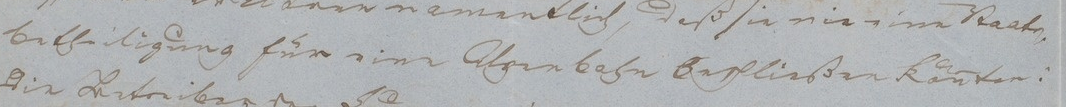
betheiligung für eine Alpenbahn beschließen könnten:
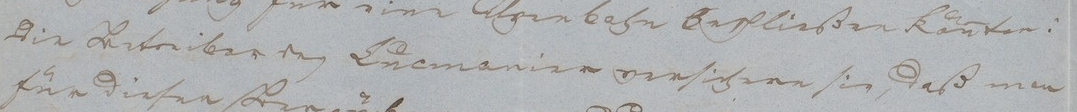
Die Betreiber des Lucmanier versichern sie, daß man
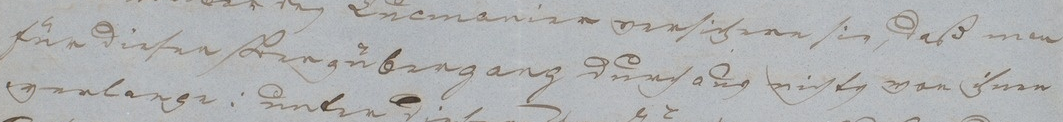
für diesen Bergübergang durchaus nichts von ihnen
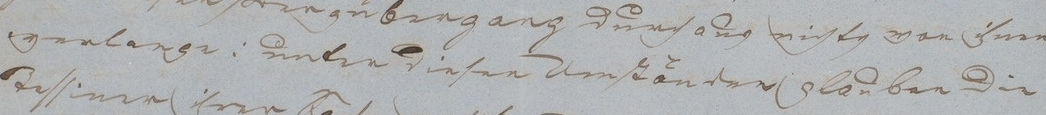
verlange: unter diesen Umständen glauben die
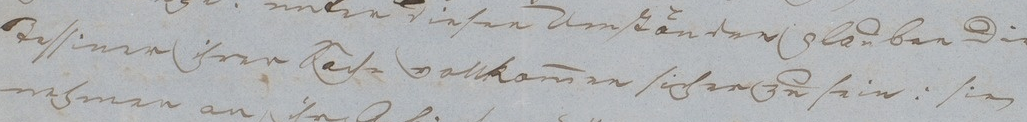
Tessiner ihrer Sache vollkommen sicher zu sein: sie
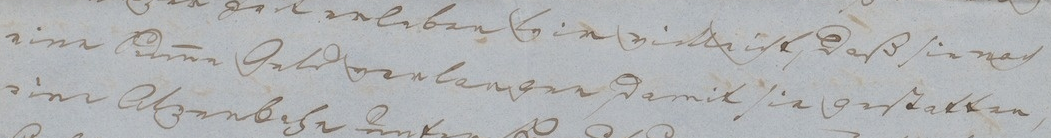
eine Summe Geld verlangen, damit sie gestatten,
